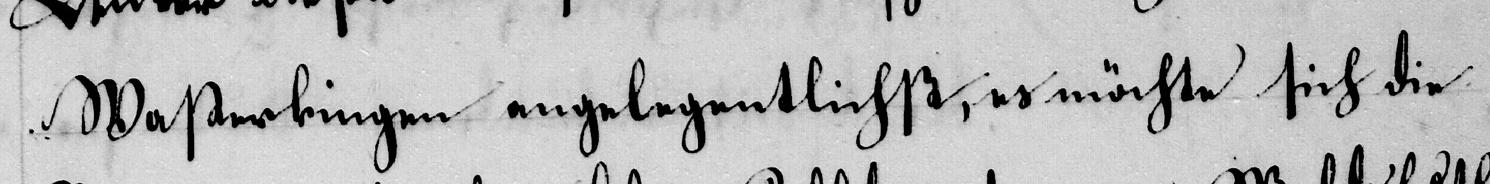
Wasterkingen angelegentlichst, es möchte sich die
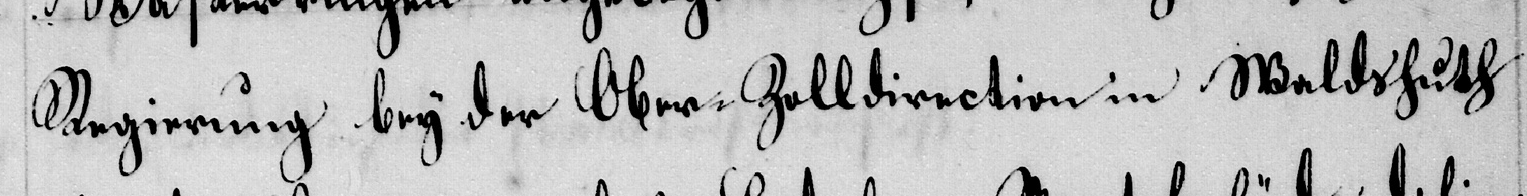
Regierung bey der Ober-Zolldirection in Waldshuth
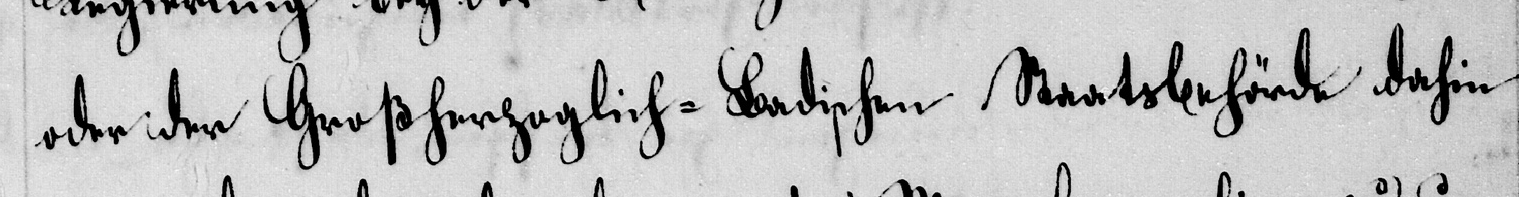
oder der Großherzoglich-Badischen Staatsbehörde dahin
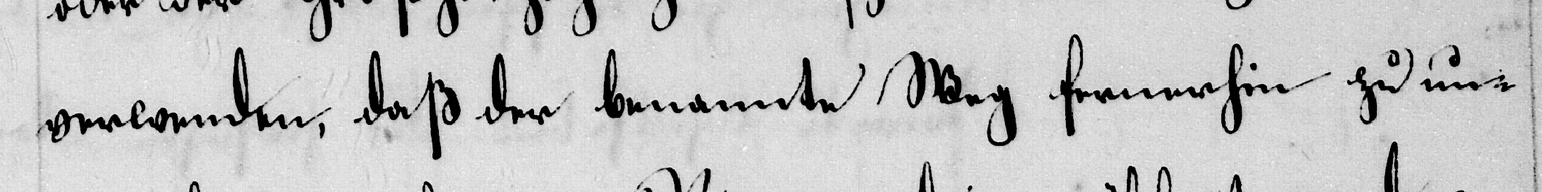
verwenden, daß der benannte Weg fernerhin zu un¬
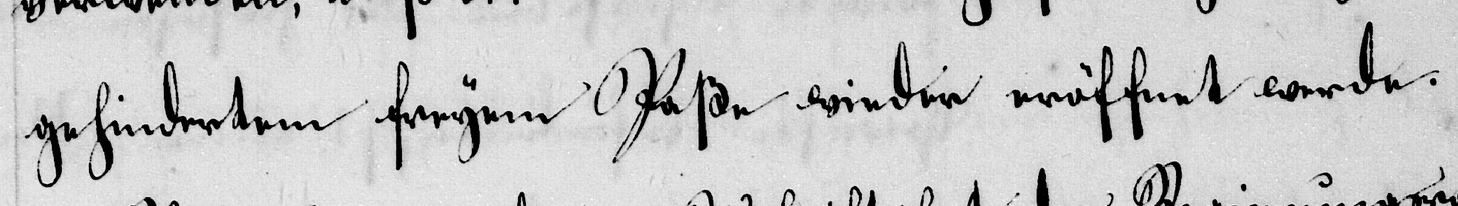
gehindertem freyen Paße wieder eröffnet werde.
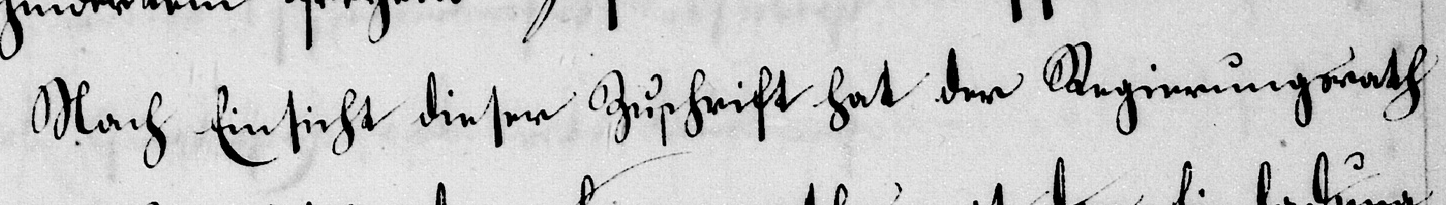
Nach Einsicht dieser Zuschrift hat der Regierungsrath
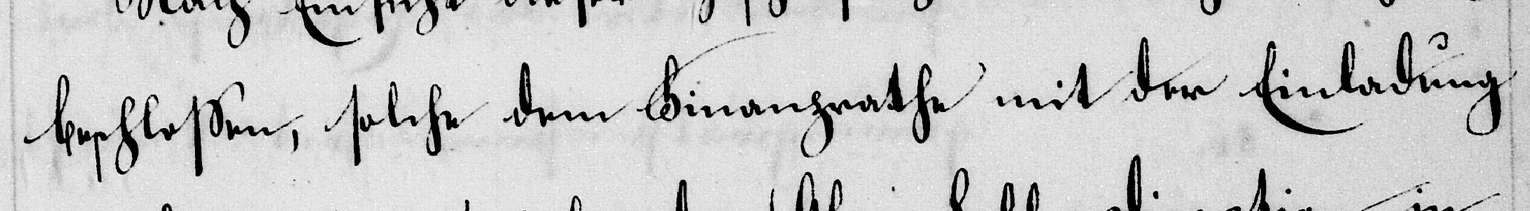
beschloßen, solche dem Finanzrathe mit der Einladung
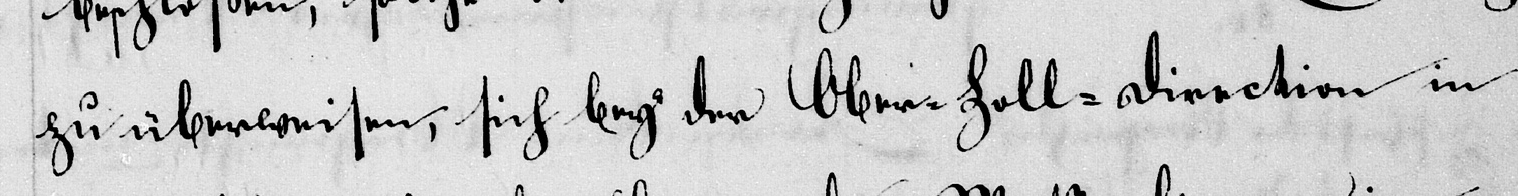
zu überweisen, sich bey der Ober-Zoll-Direction in
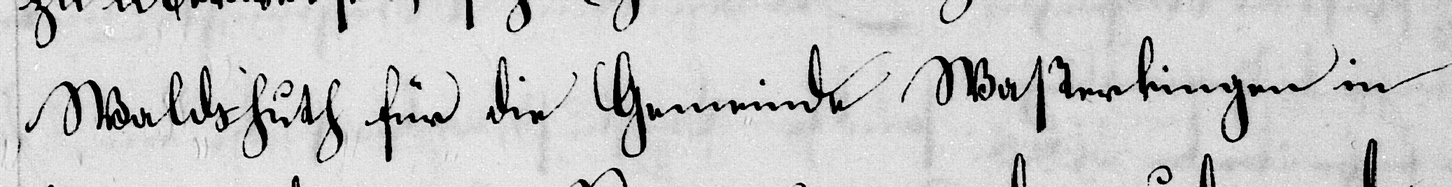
Waldshuth für die Gemeinde Wasterkingen in
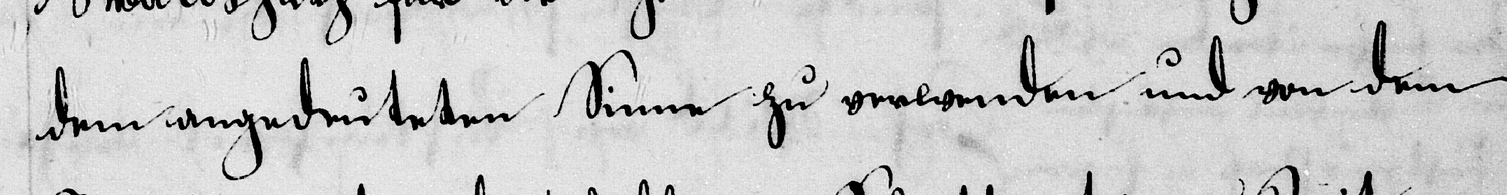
dem angedeuteten Sinne zu verwenden und von dem
